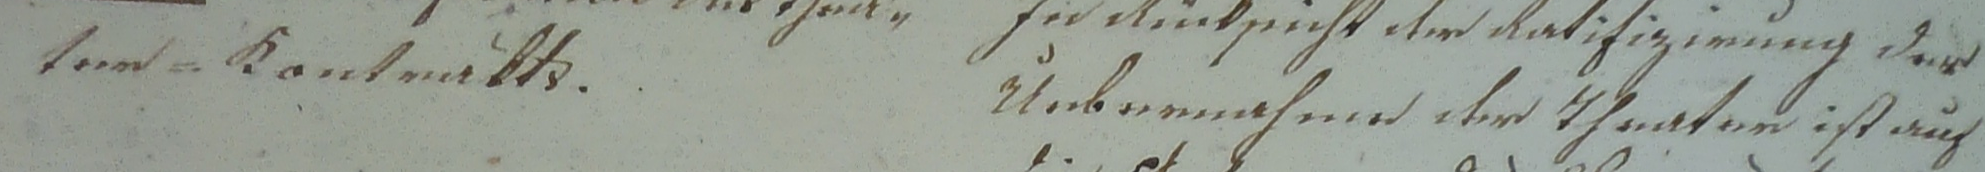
ter=Kontrakts.
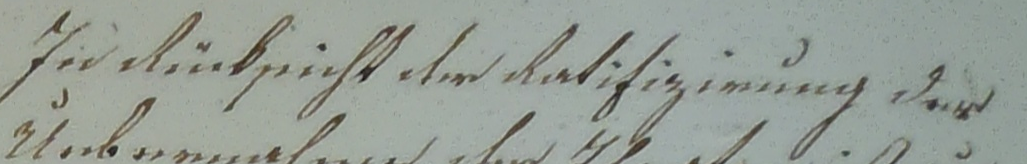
In Rücksicht der Ratifizirung der
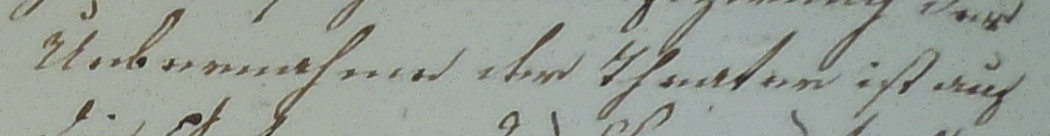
Übernahme der Theater ist auf
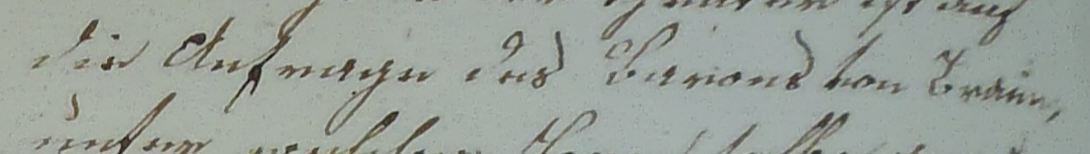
die Anfrage des Barons von Craim,
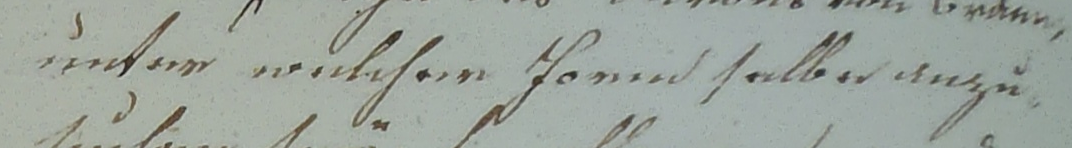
unter welcher Form selber anzu¬
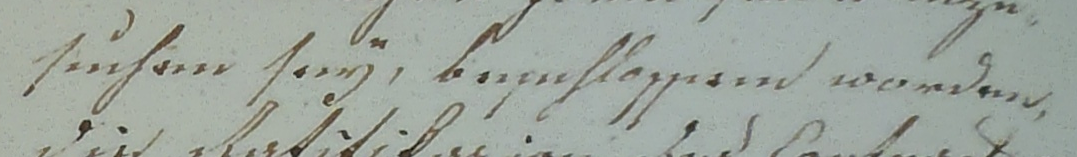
suchen sey, beschlossen worden,
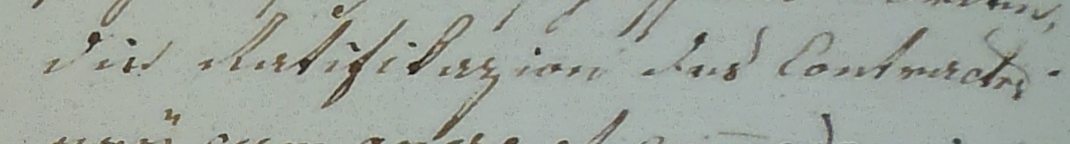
die Ratifikazion des Contractes
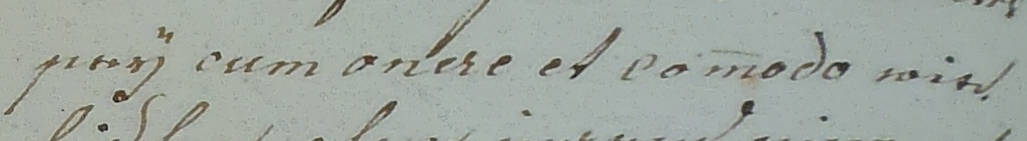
sey cum onere et com̅odo wie
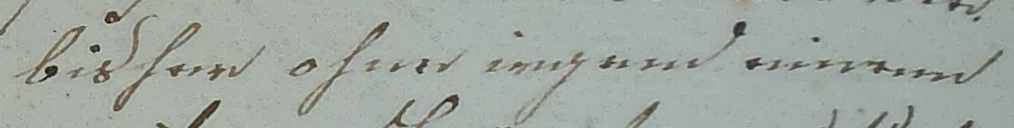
bisher ohne irgend einem
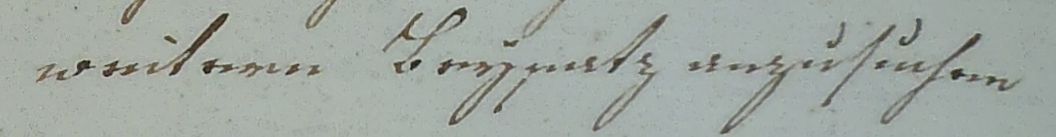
weitern Beysatz anzusuchen
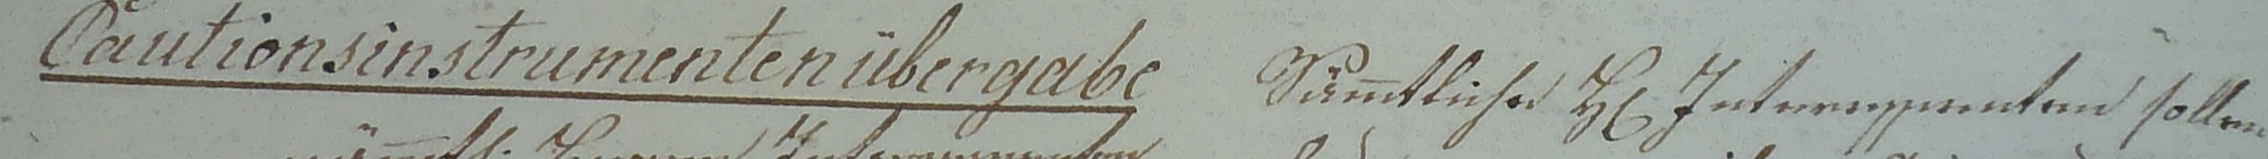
Cautionsinstrumentenübergabe
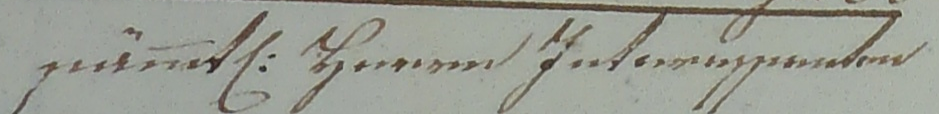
sämtE: Herren Interessenten
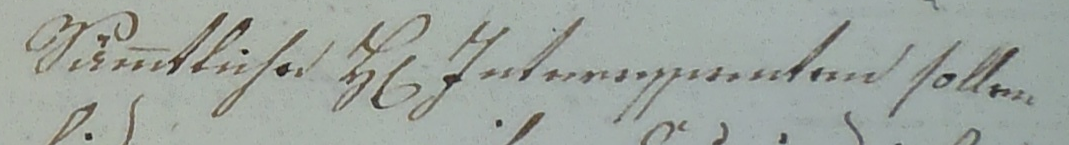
Säm̅tliche HE Interessenten sollen
